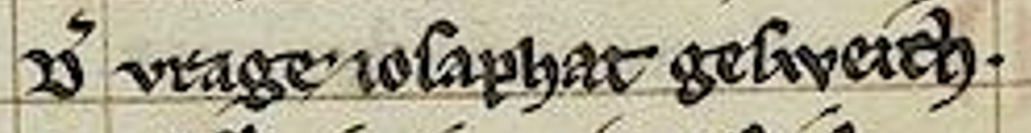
D(er) vrage ioſaphat geſweich.
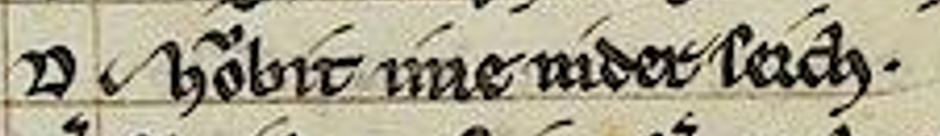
D(az) ho°vbit ime nider ſeich.
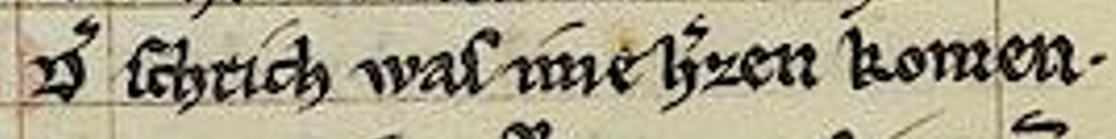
D(er) ſchrich waſ ime h(er)zen komen.
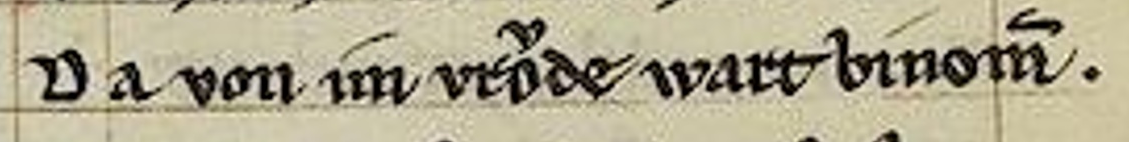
Da von im vro°vde wart binom(n).
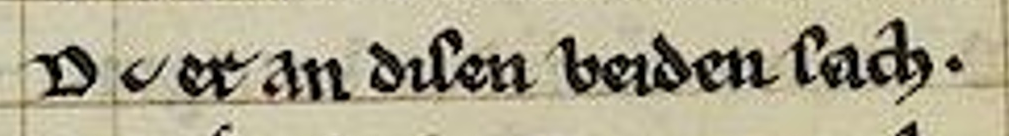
D(az) er an diſen beiden ſach.
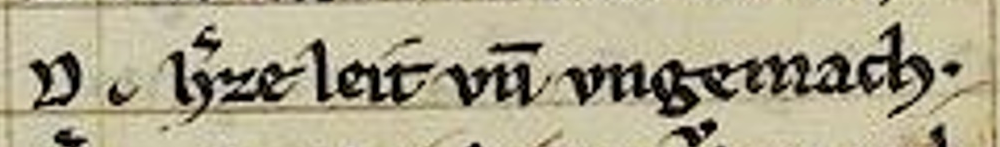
D(az) h(er)ze leit vn(d) vngemach.
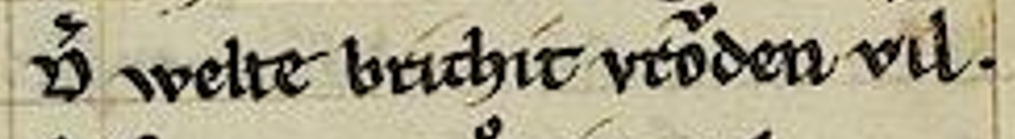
D(er) welte brichit vro°vden vil.
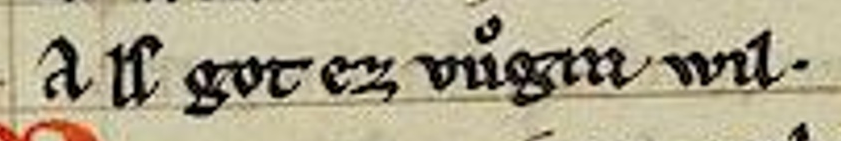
Alſ got ez vu°ogin wil.
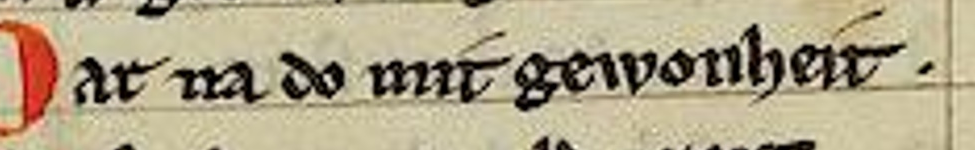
*Dar na do mit gewonheit.
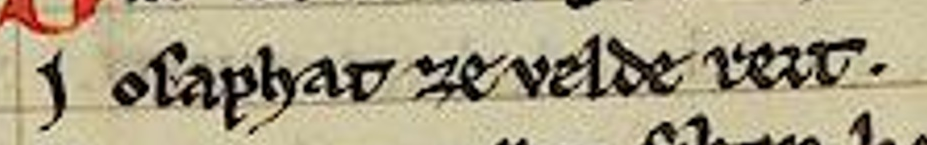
Josaphat ze velde reit.
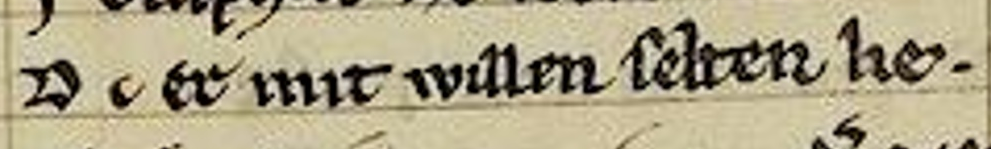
D(az) er mit willen ſelten lie.
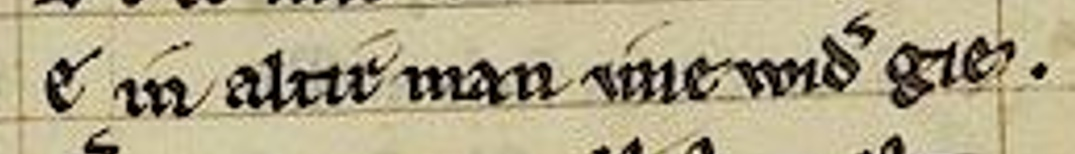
Ein altir man ime wid(er) gie.
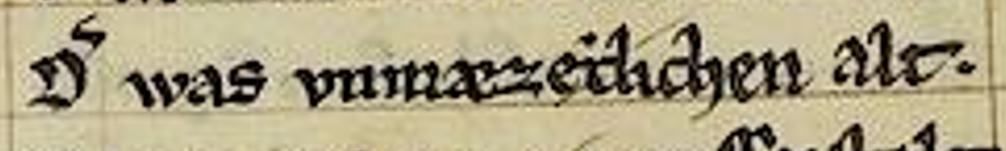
D(er) was unm[ae]zeclichen alt.
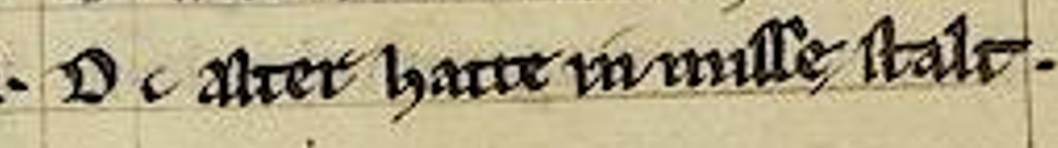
D(az) alter hatte in miſſe ſtalt.
